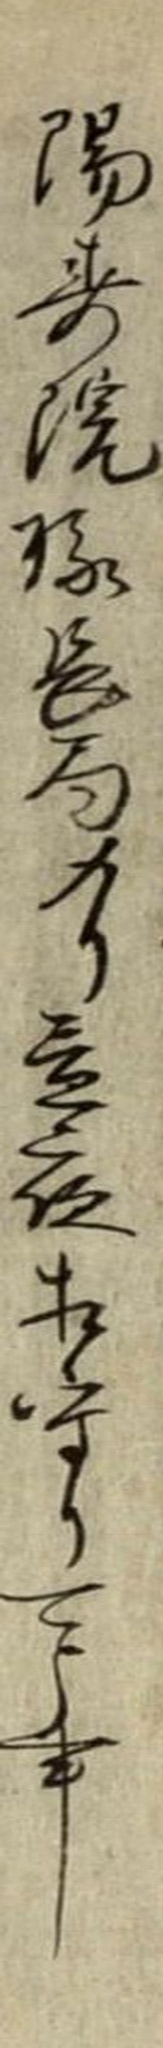一陽寿院様長局〆り昼夜相守り可申事
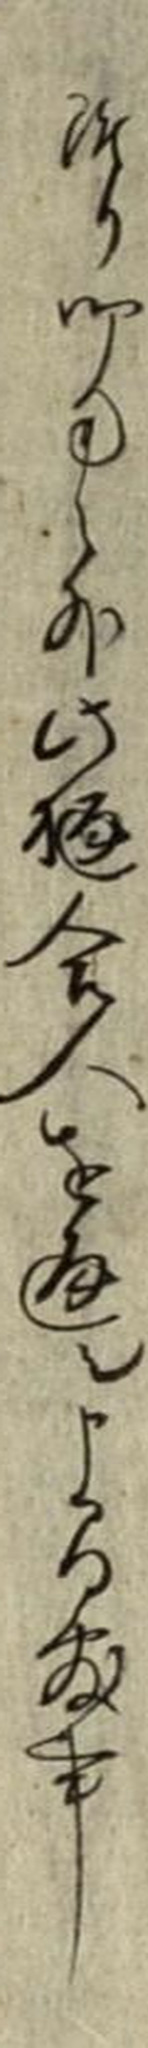附り御用之外此聴合人を通し申間敷事
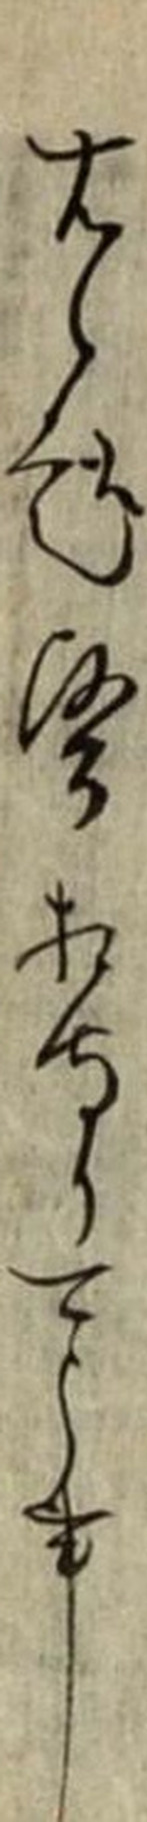右之趣堅相守り可申事
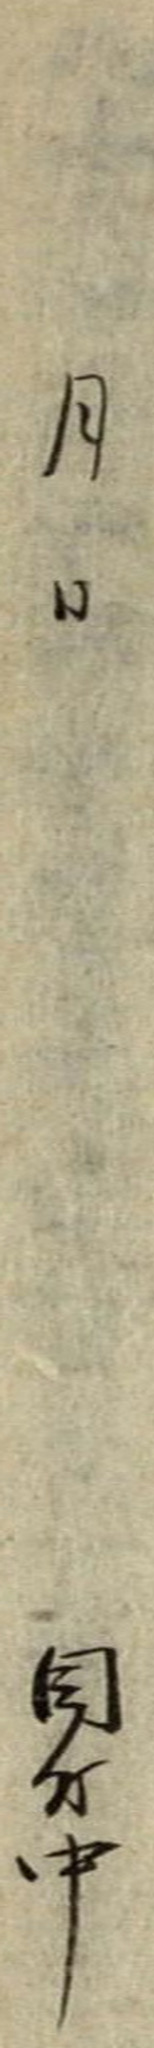月日目付中
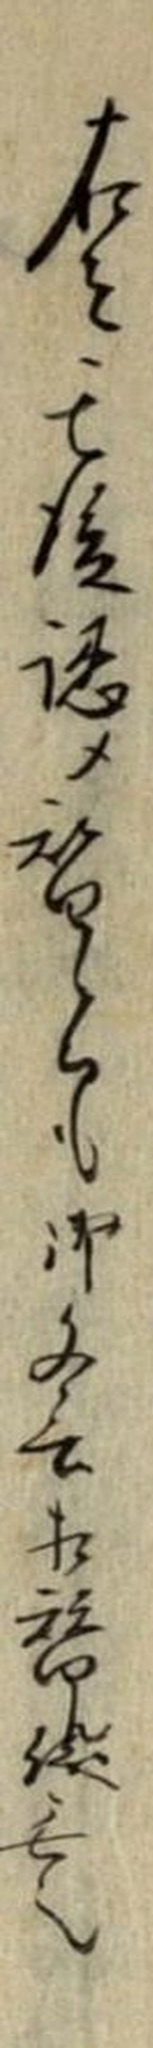右は其後認め替候ても御文言相替候儀無之
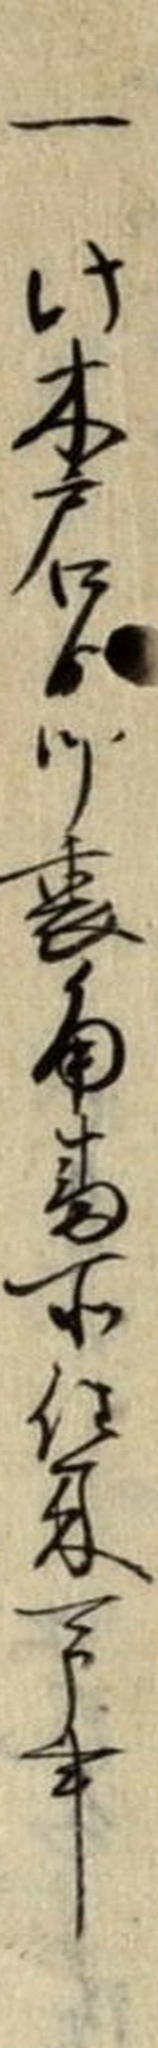一此木戸口ゟ御裏角番所往来可申事
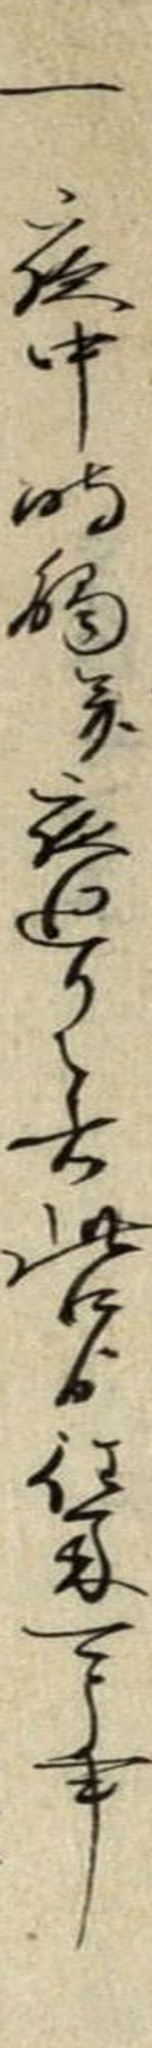一夜中時触幷夜廻り之者此口ゟ往来可申事
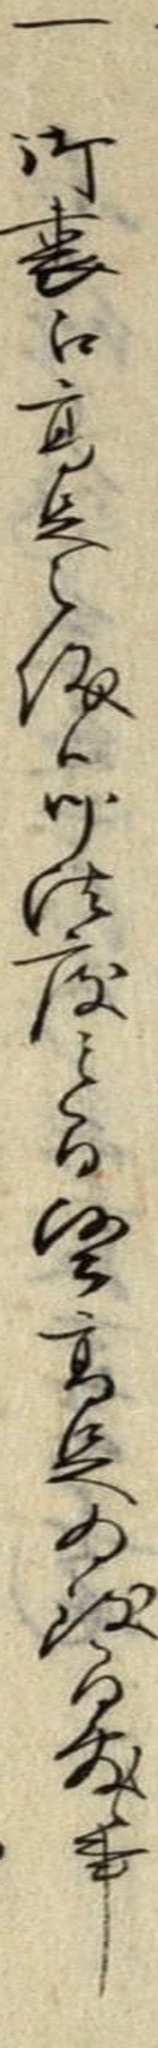一御裏江高足之儀は御法度に候間堅高足為致間敷事
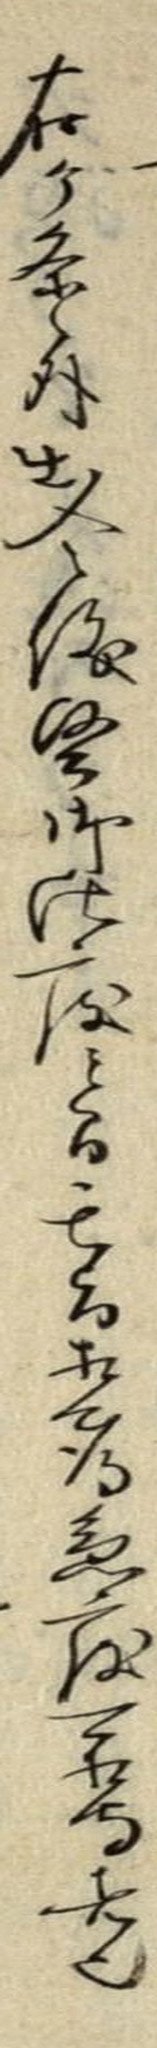右ケ条之外出入之儀堅御法度に候間其旨相心得急度可相守者也
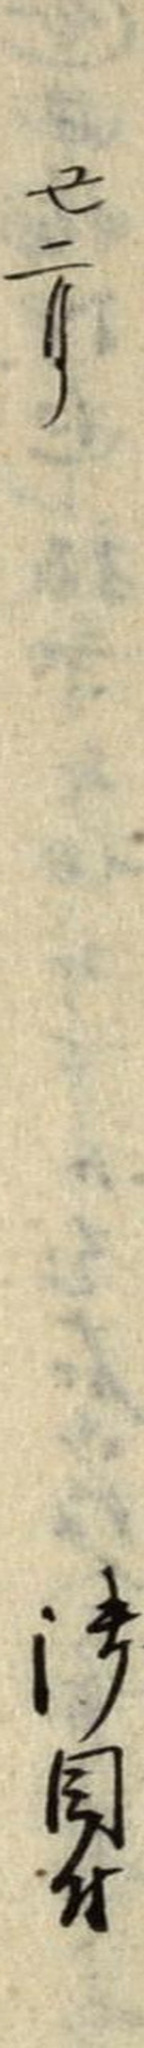丑二月御目付
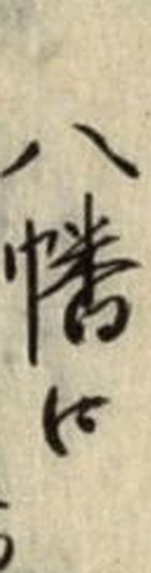八幡口
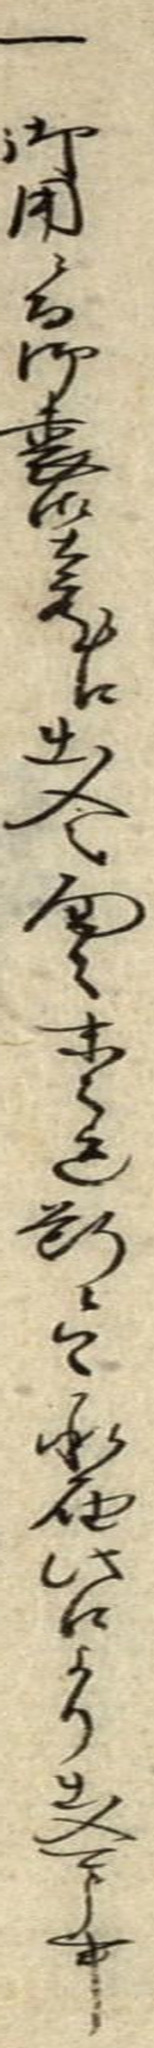一御用にて御裏御土蔵江出入之面々末々迄断候はゝ承届此口より出入可申事
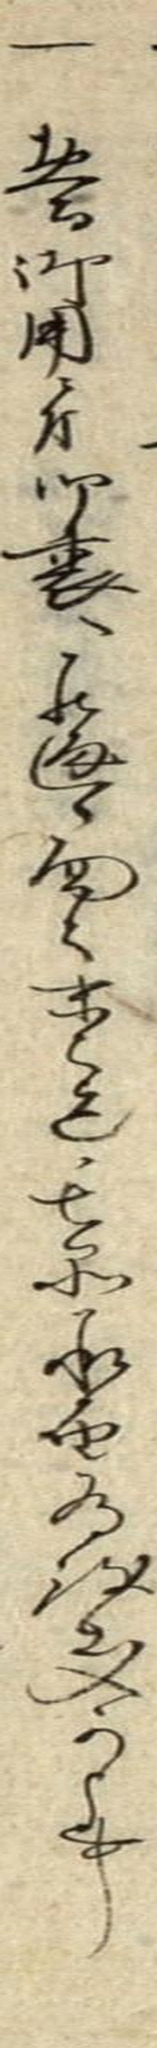一惣て御用に付御裏へ罷通候面々末々迄其品承届為致出入可申事
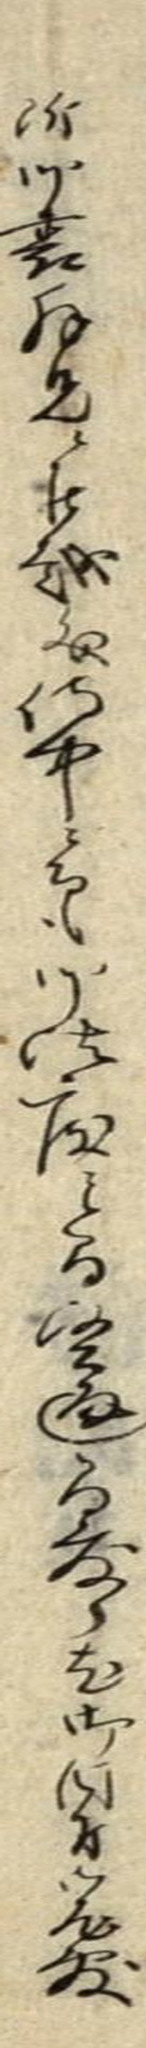附御裏拝見に罷越義侍中にても御法度に候間堅通間敷候尤御目付御屋敷
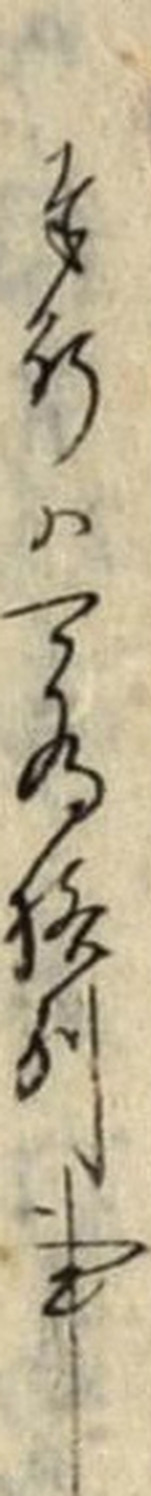奉行は可為格別事
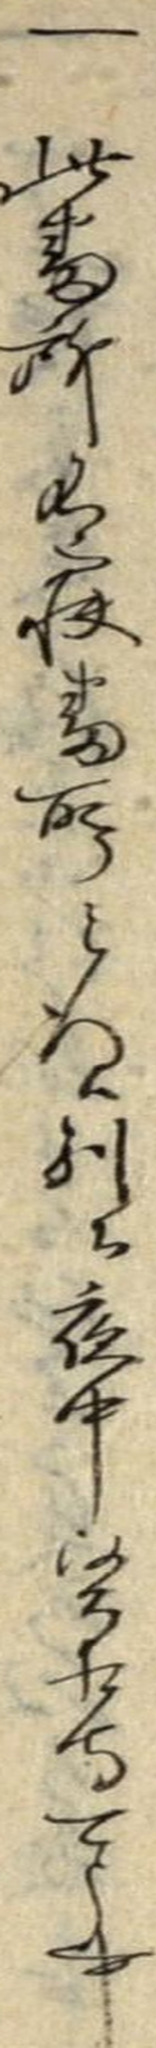一此番所不寝番所に候得は別て夜中堅相守可申事
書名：三都并道中之部
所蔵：福井県文書館 Fukui Prefectural Archives
